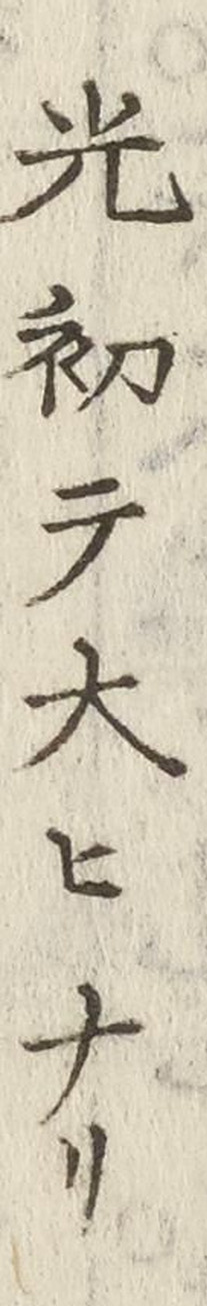光初テ大ヒナリ
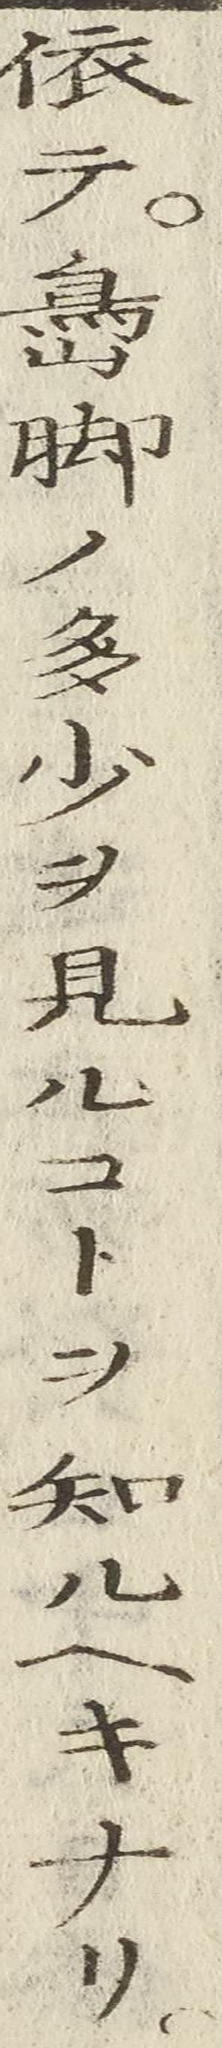依テ。嶋脚ノ多少ヲ見ルコトヲ知ルヘキナリ。
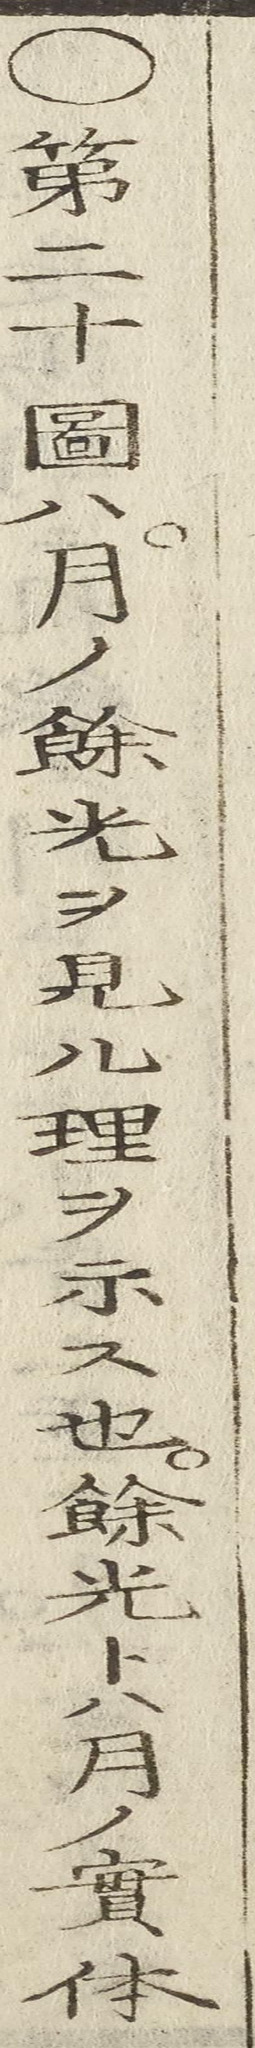○第二十図ハ。月ノ余光ヲ見ル理ヲ示ス也。余光トハ月ノ実体
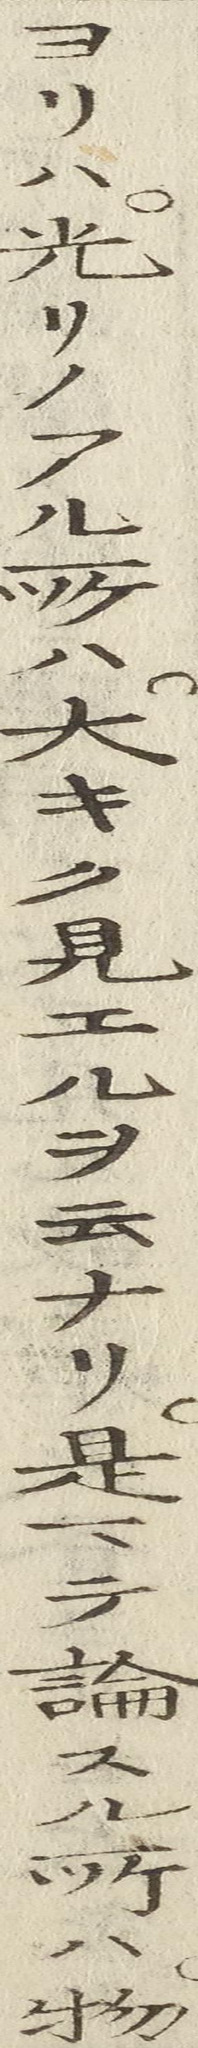ヨリハ。光リノアル所ハ。大キク見エルヲ云ナリ。是マテ論スル所ハ。物
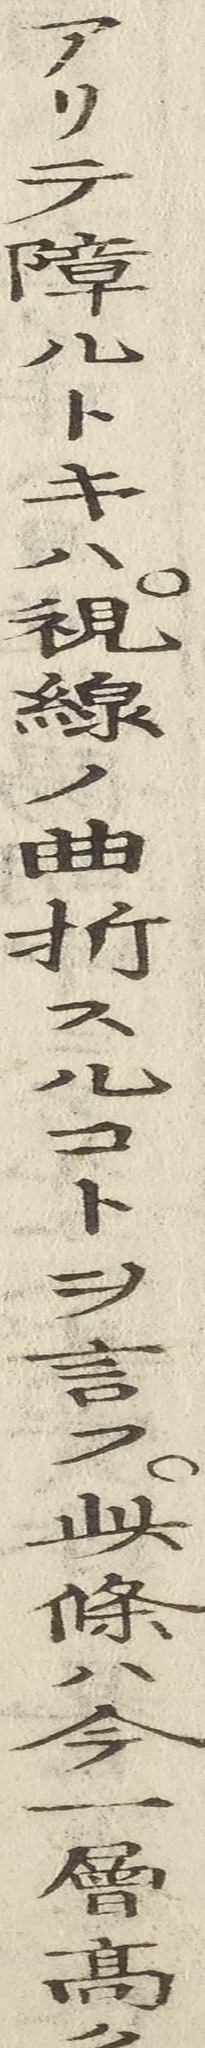アリテ障ルトキハ。視線ノ曲折スルコトヲ言フ。此条ハ今一層高ク
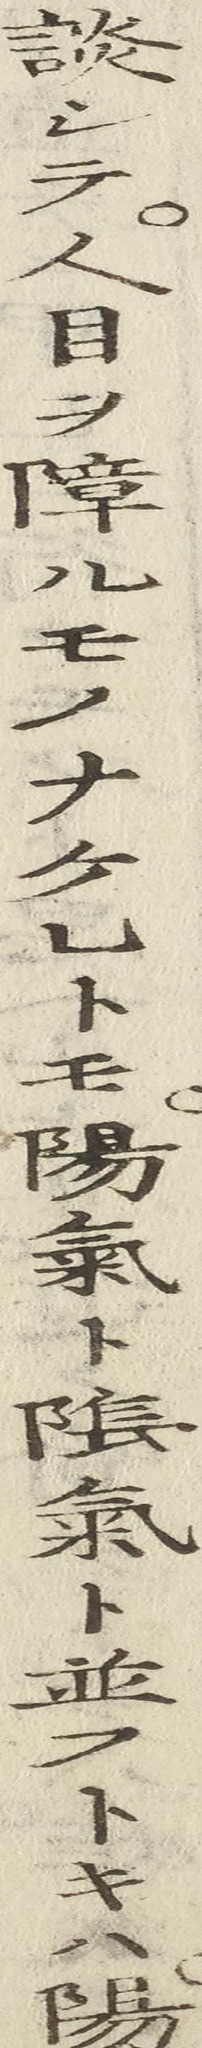談シテ。人目ヲ障ルモノナケレトモ。陽気ト陰気ト並フトキハ。陽
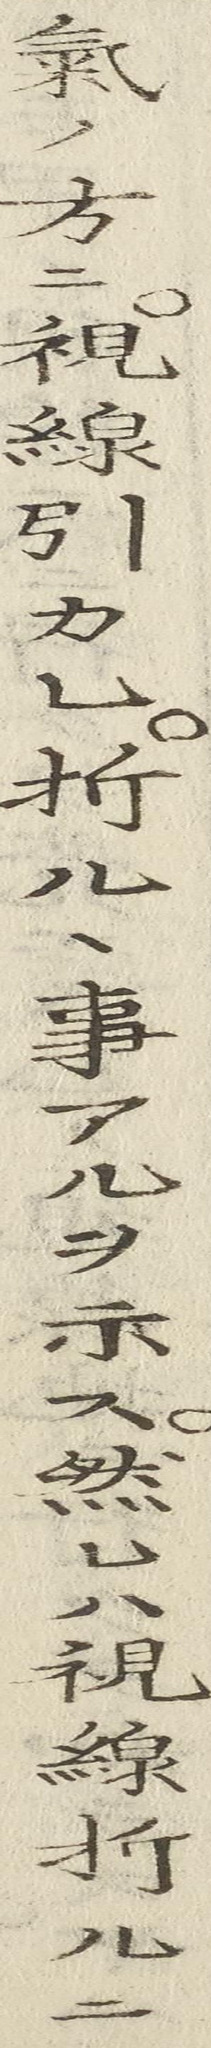気ノ方ニ。視線引カレ。折ルヽ事アルヲ示ス。然レハ視線折ルニ
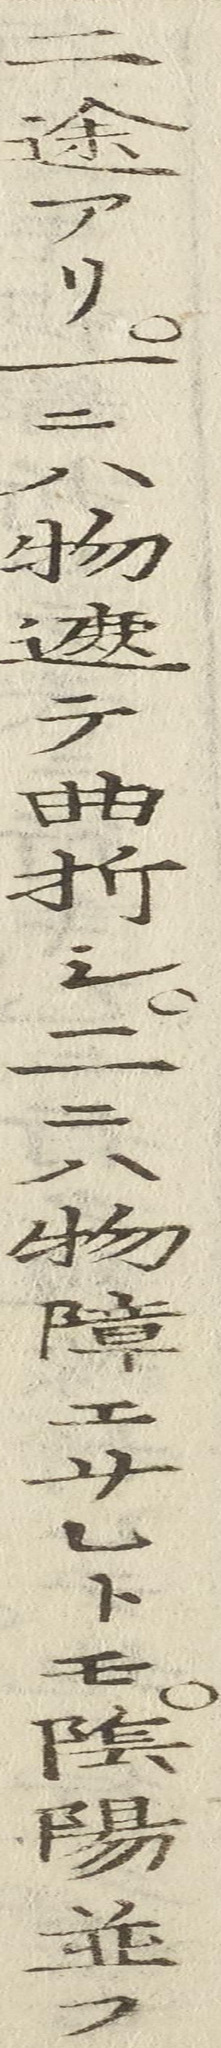二途アリ。一ニハ物遮テ曲折シ。二ニハ物障エサレトモ。陰陽並フ
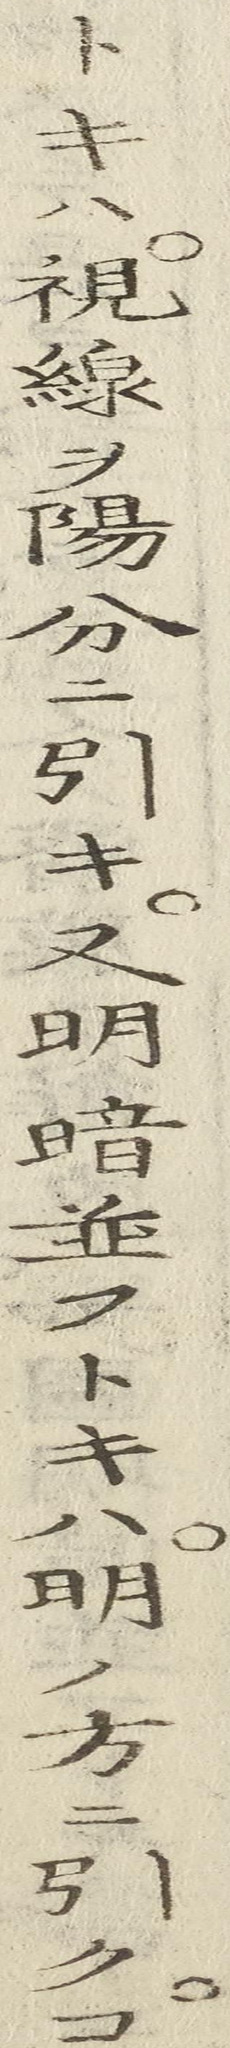トキハ。視線ヲ陽分ニ引キ。又明暗並フトキハ。明ノ方ニ引ク。コ
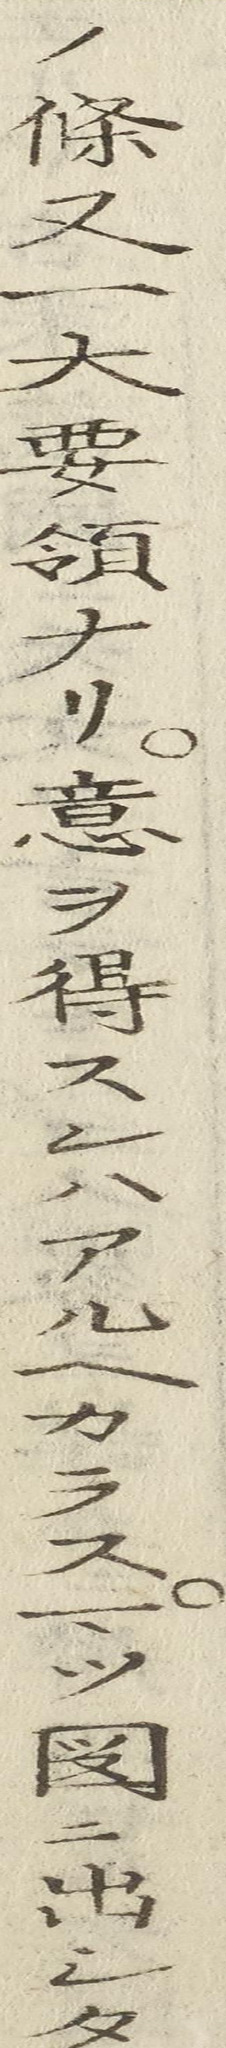ノ条又一大要領ナリ。意ヲ得スンハアルヘカラス。マツ図ニ出シタ
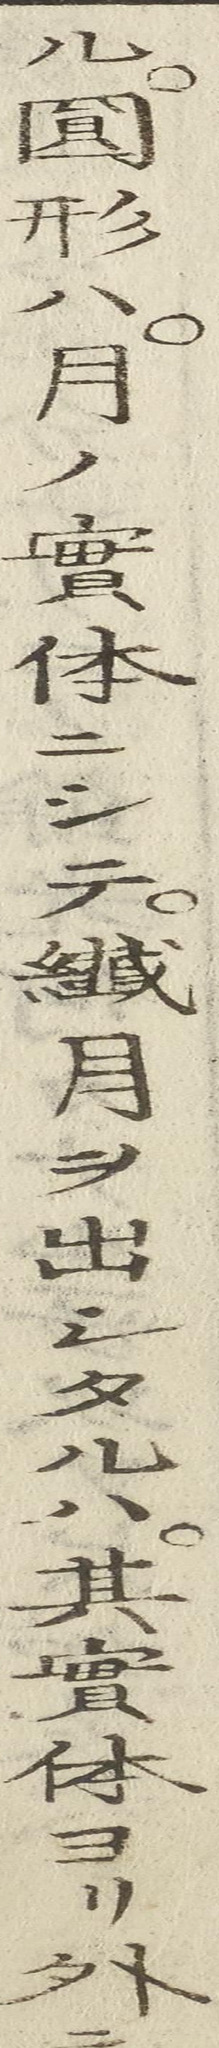ル。円形ハ。月ノ実体ニシテ。繊月ヲ出シタルハ。其実体ヨリ外ニ

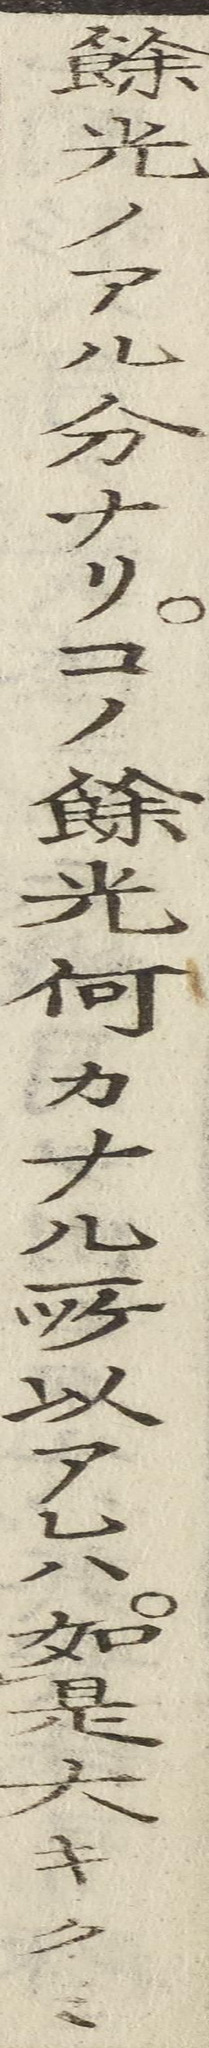余光ノアル分ナリ。コノ余光何カナル所以アレハ。如是大キクミ
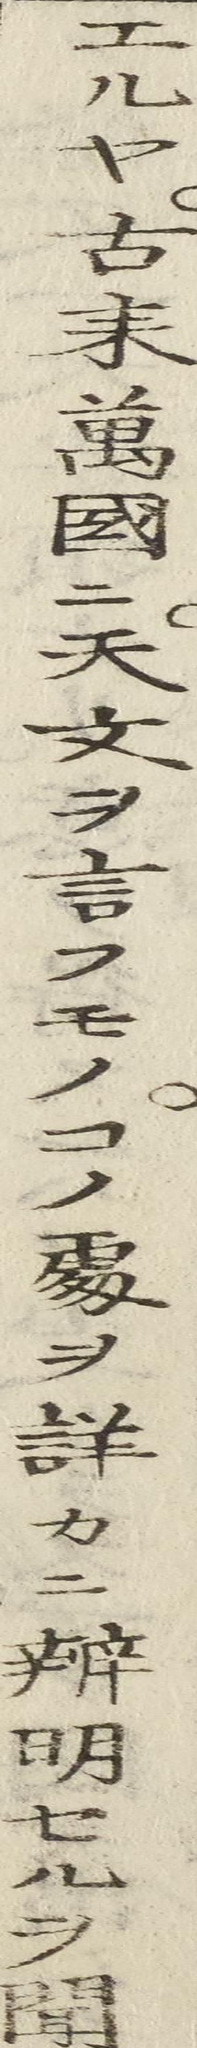エルヤ。古来万国ニ。天文ヲ言フモノ。コノ処ヲ詳カニ弁明セルヲ聞
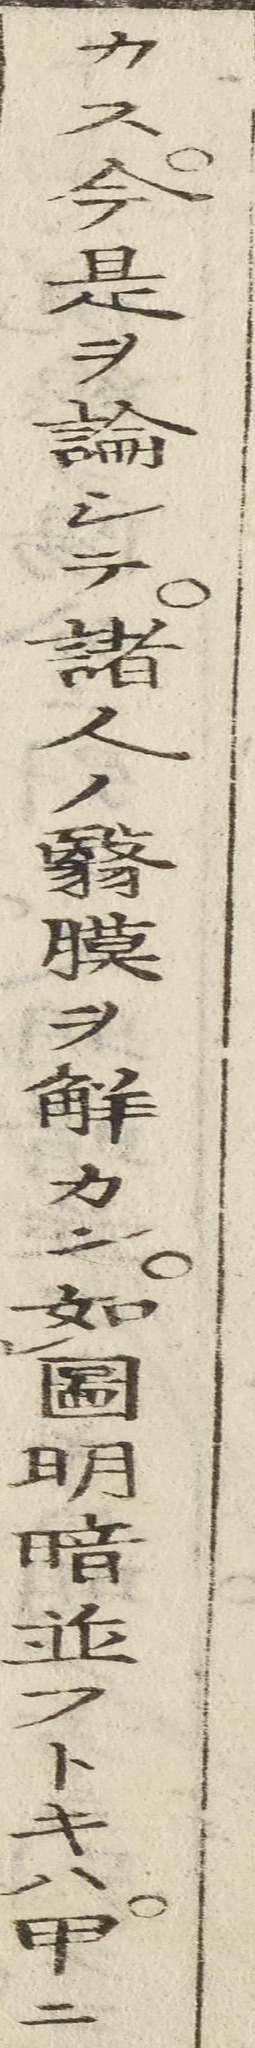カス。今是ヲ論シテ。諸人ノ翳膜ヲ解カン。如図明暗並フトキハ。甲ニ
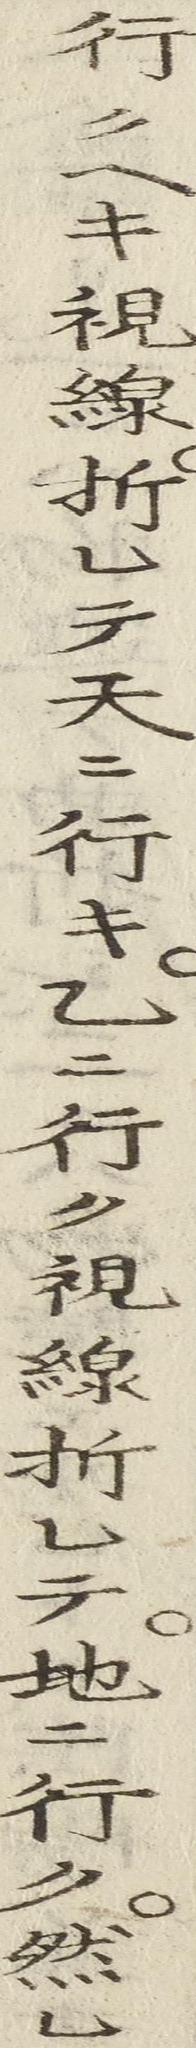行クヘキ視線。折レテ天ニ行キ。乙ニ行ク視線折レテ。地ニ行ク。然レ
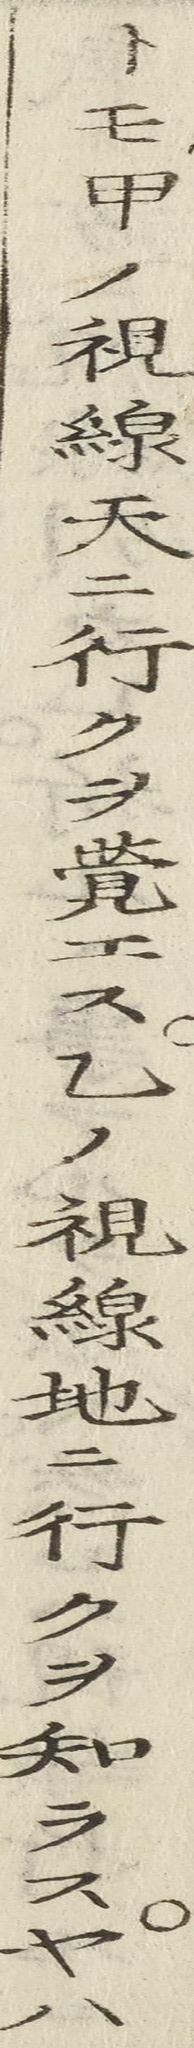トモ。甲ノ視線天ニ行クヲ覚エス。乙ノ視線地ニ行クヲ知ラス。ヤハ
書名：護法新論　上
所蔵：東京大学地震研究所図書室 Earthquake Research Institute Library, The University of Tokyo, JAPAN
